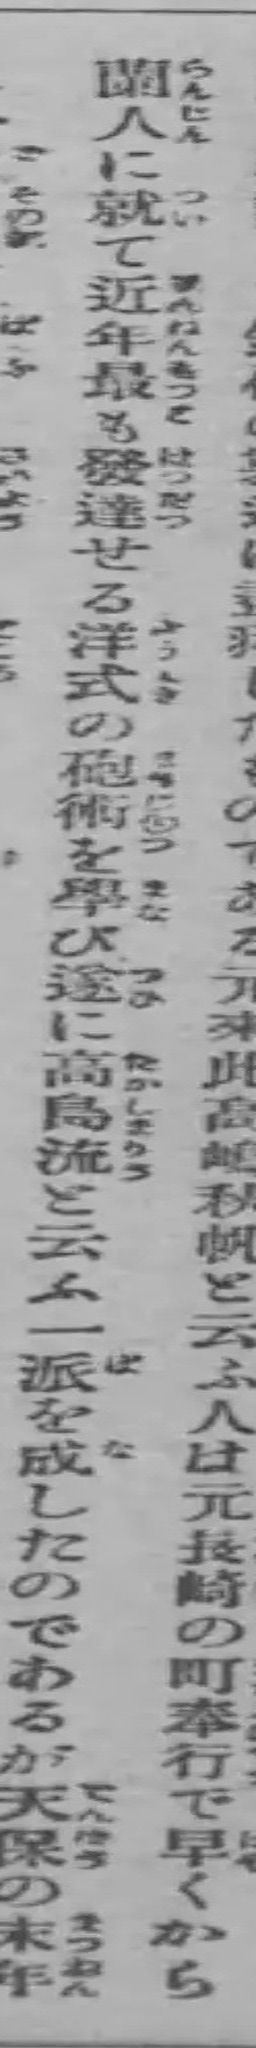蘭人に就て近年最も発達せる洋式の砲術を学び遂に高島流と云ふ一派を成したのであるが天保の末年
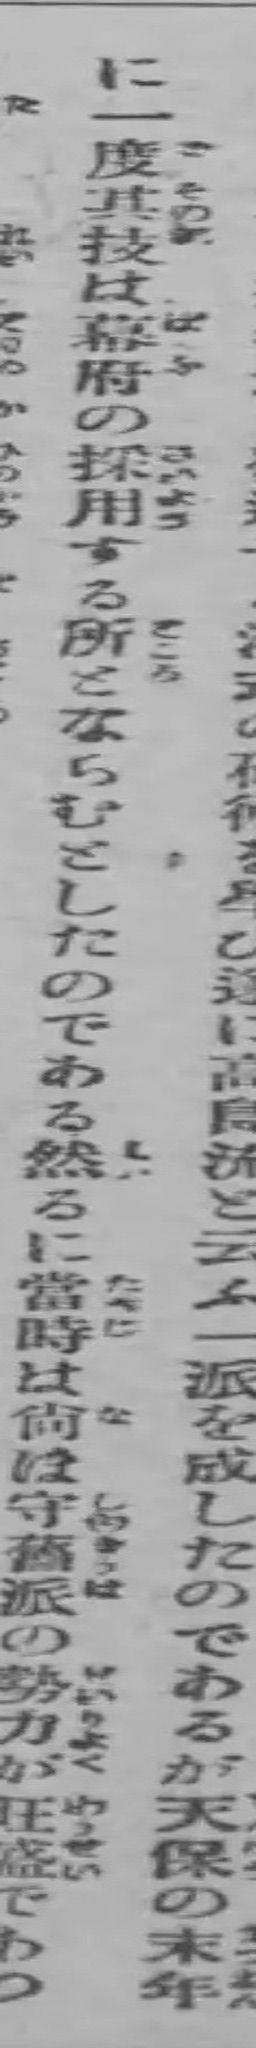に一度其技は幕府の採用する所とならむとしたのである然るに当時は尚ほ守旧派の勢力が旺盛であつ
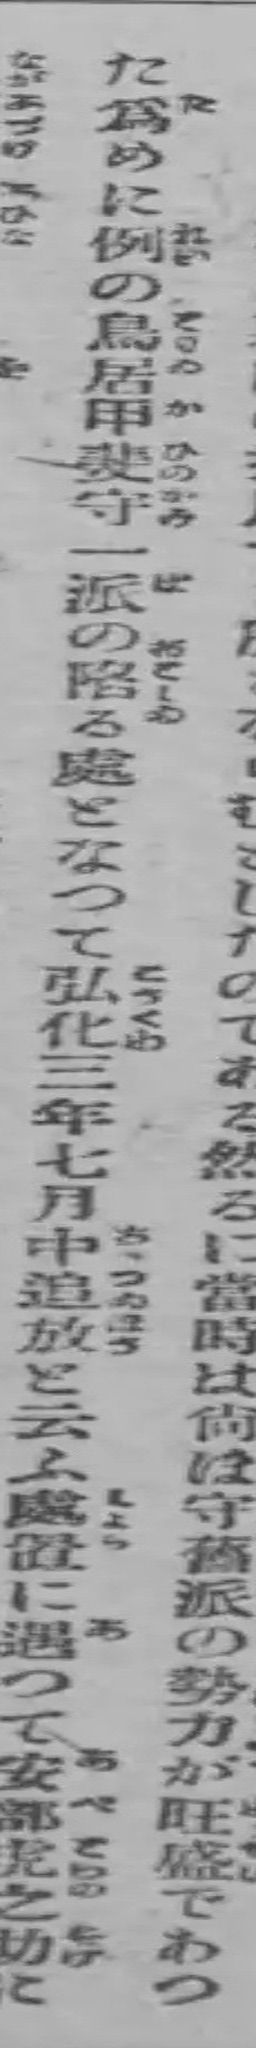た為めに例の鳥居甲斐守一派の陥る処となつて弘化三年七月中追放と云ふ処置に遭つて安部虎之助に
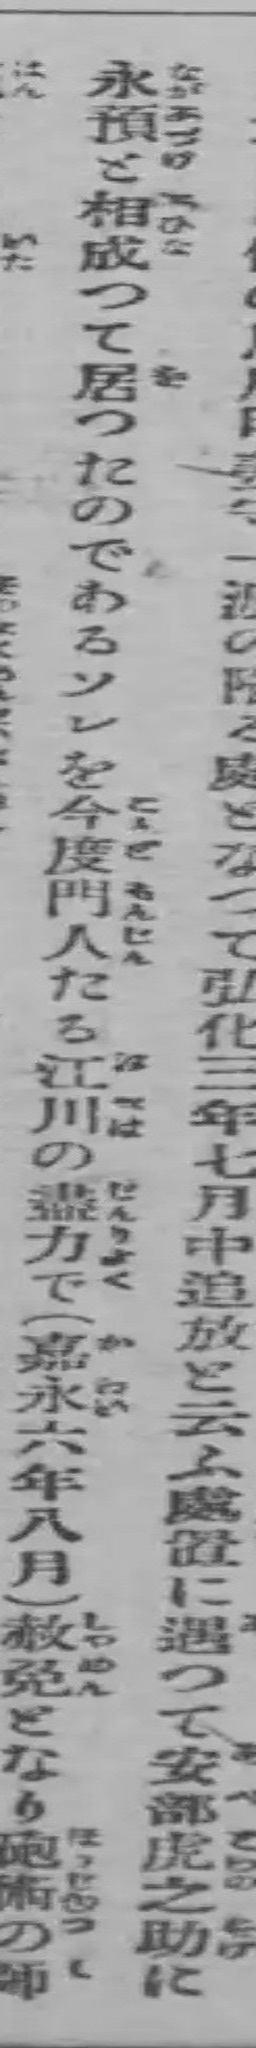永預と相成つて居つたのであるソレを今度門人たる江川の尽力で(嘉永六年八月)赦免となり砲術の師
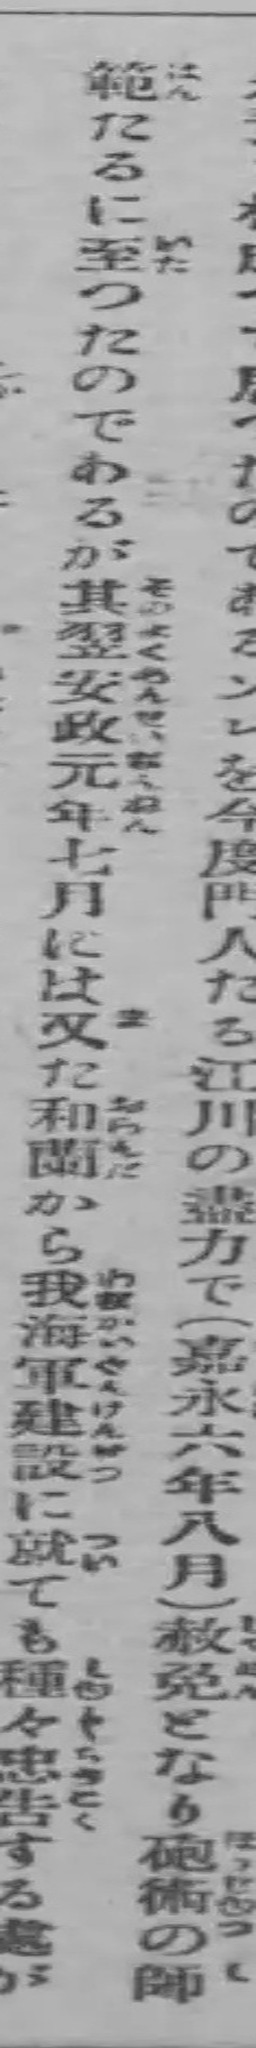範たるに至つたのであるが其翌安政元年七月には又た和蘭から我海軍建設に就ても種々忠告する処が
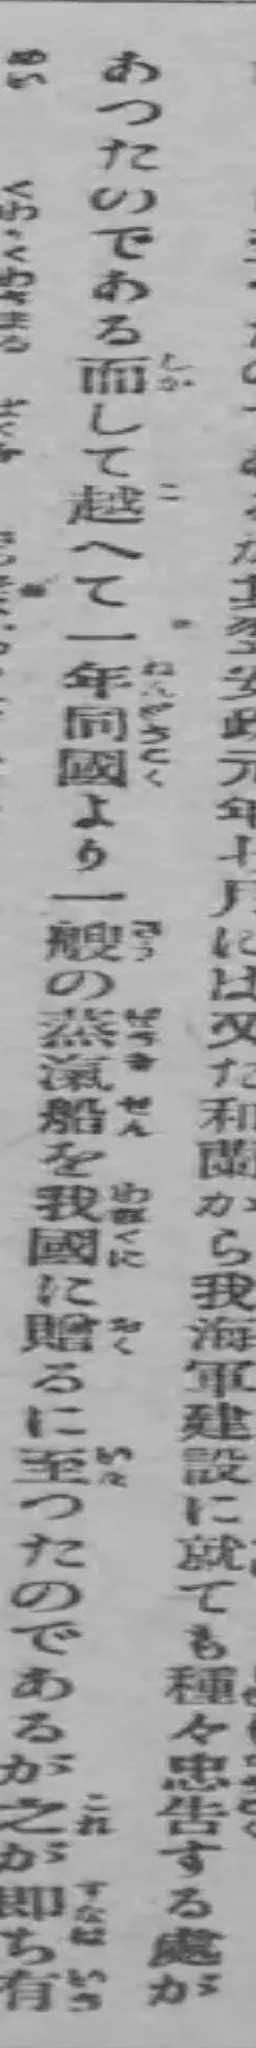観光丸あつたのである而して越へて一年同国より一艘の蒸気船を我国に贈るに至つたのであるが之が即ち有
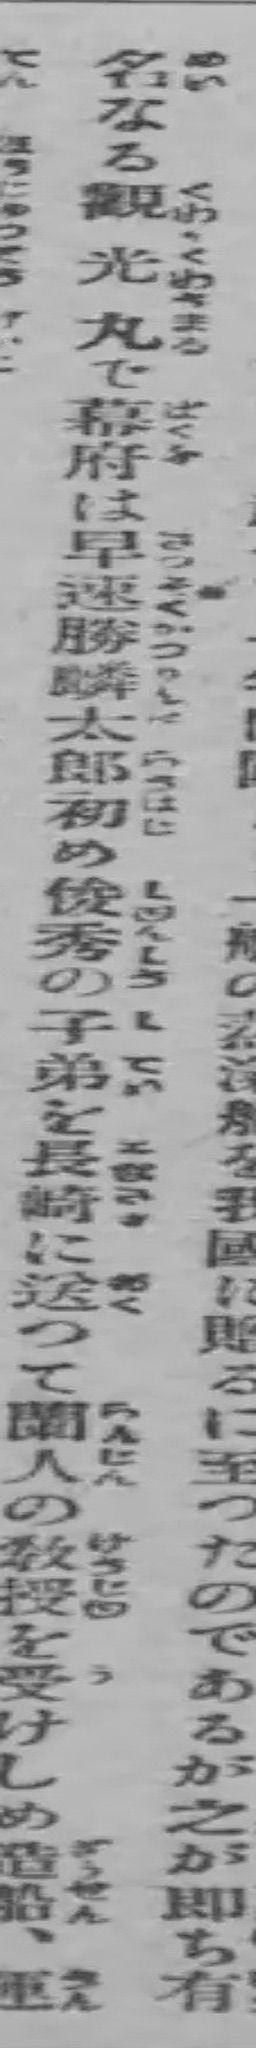名なる観光丸で幕府は早速勝麟太郎初め俊秀の子弟を長崎に送つて蘭人の教授を受けしめ造船、運
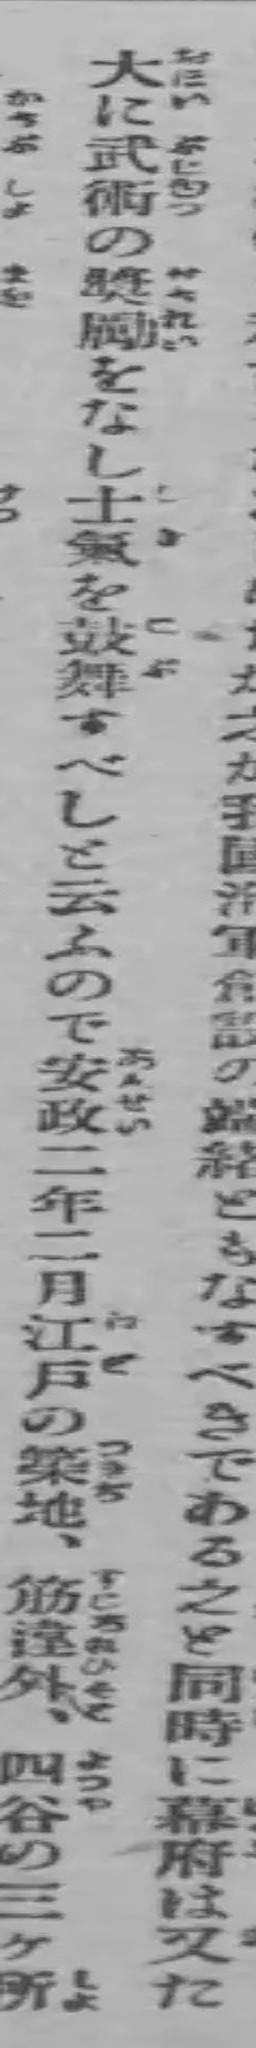講武所大に武術の奨励をなし士気を鼓舞すべしと云ふので安政二年二月江戸の築地、筋違外、四谷の三ヶ所
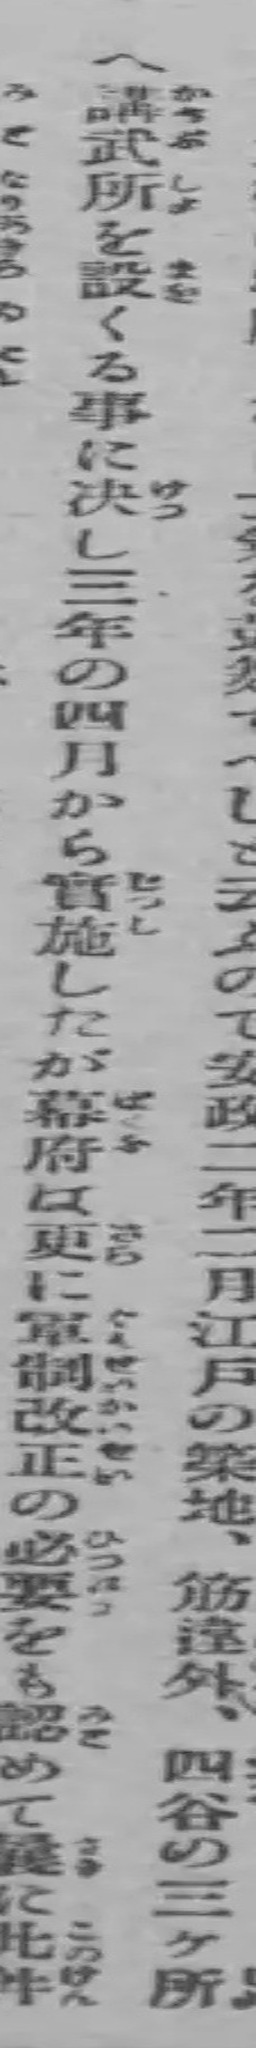へ講武所を設くる事に決し三年の四月から実施したが幕府は更に軍制改正の必要をも認めて曩に此件
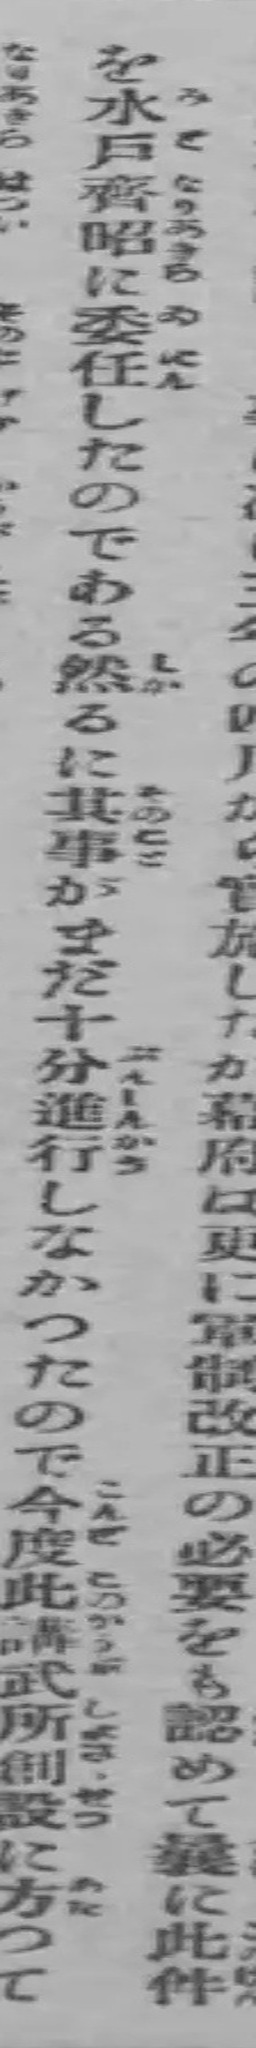を水戸斉昭に委任したのである然るに其事がまだ十分進行しなかつたので今度此講武所創設に方つて
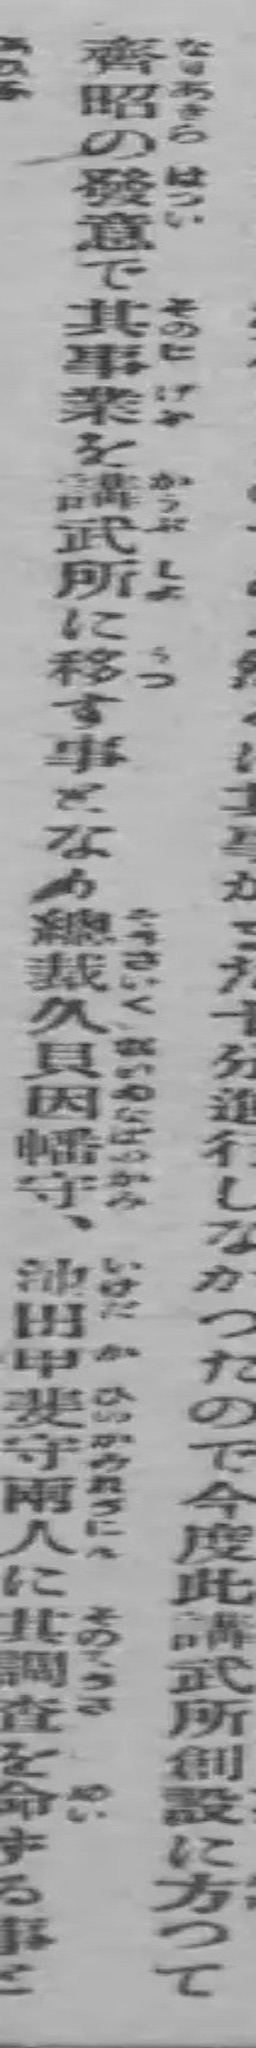斉昭の発意で其事業を講武所に移す事となり総裁久貝因幡守、池田甲斐守両人に其調査を命ずる事と
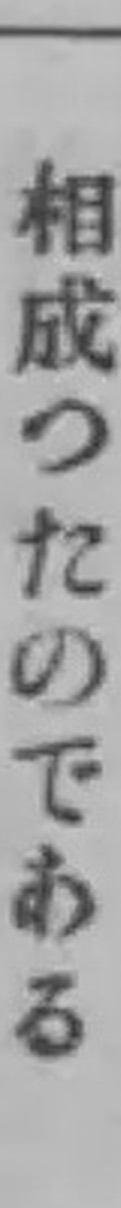相成つたのである
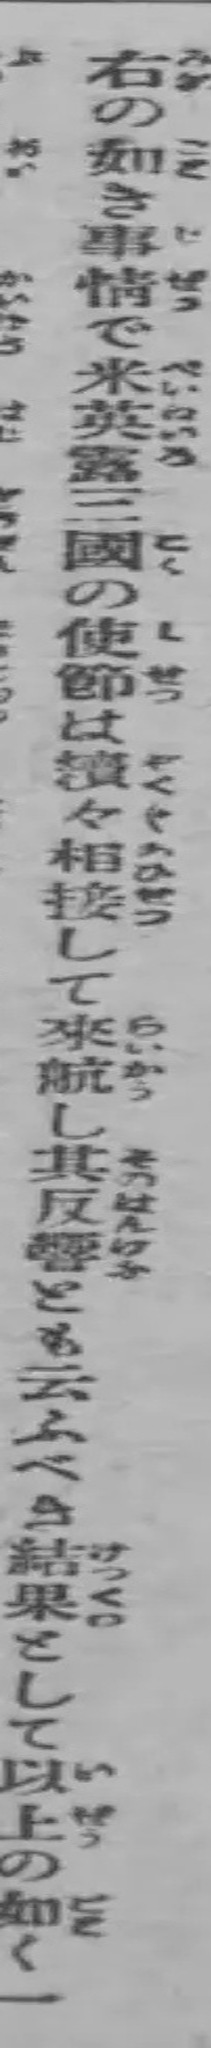右の如き事情で米英露三国の使節は続々相接して来航し其反響とも云ふべき結果として以上の如く一
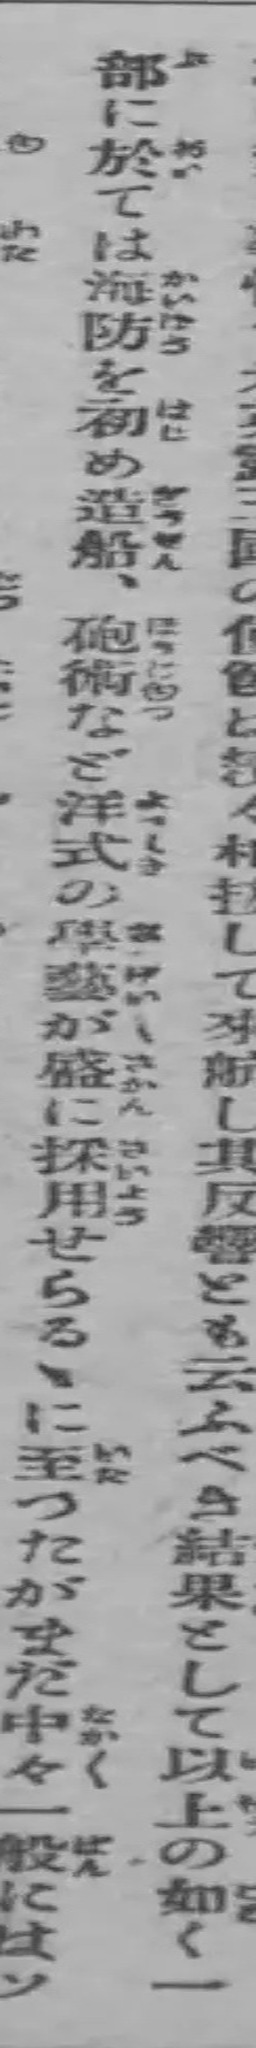部に於ては海防を初め造船、砲術など洋式の学芸が盛に採用せらるゝに至つたがまだ中々一般にはソ
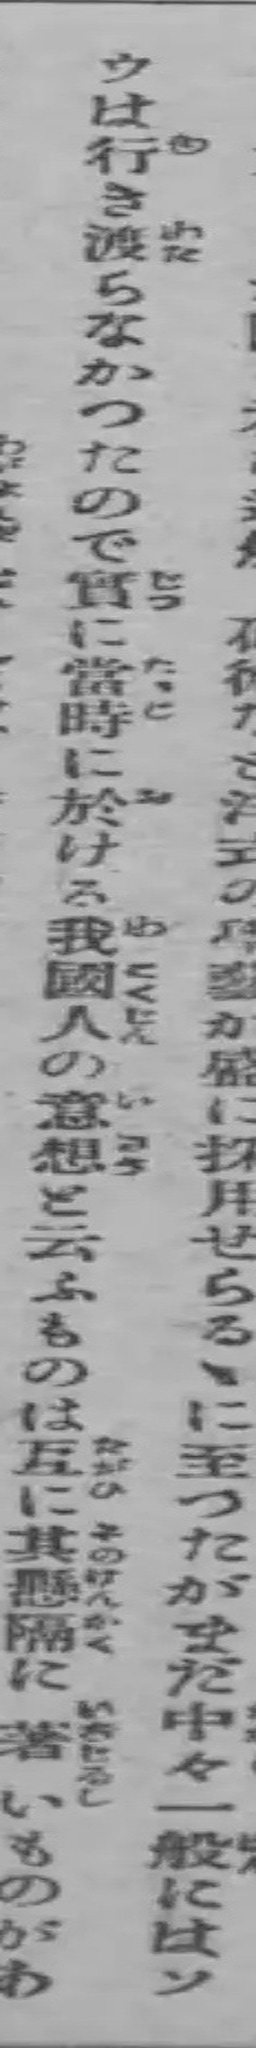ウは行き渡らなかつたので実に当時に於ける我国人の意想と云ふものは互に其懸隔に著いものがあ
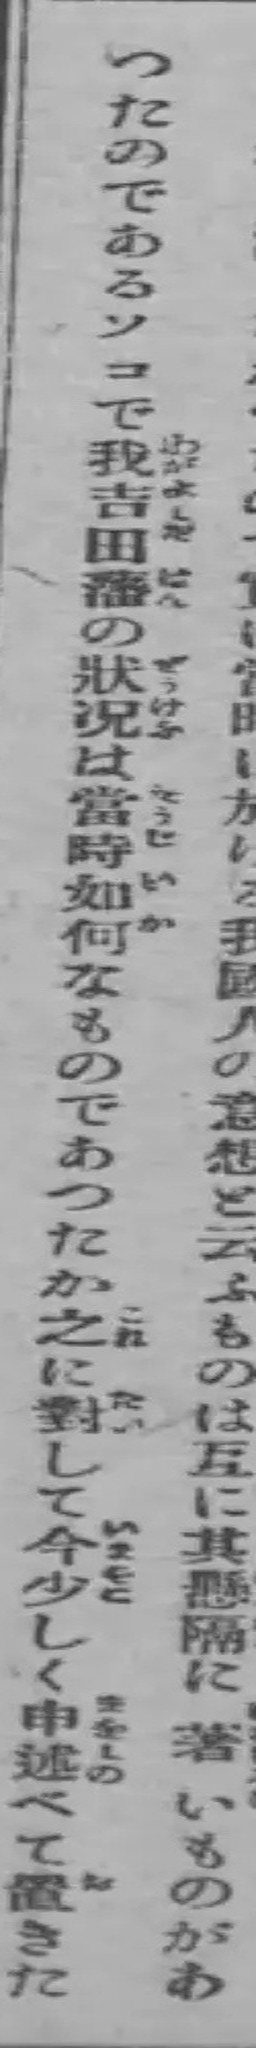つたのであるソコで我吉田藩の状況は当時如何なものであつたか之に対して今少しく申述べて置きた
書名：豊橋市史談
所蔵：国立国会図書館 National Diet Library, JAPAN
